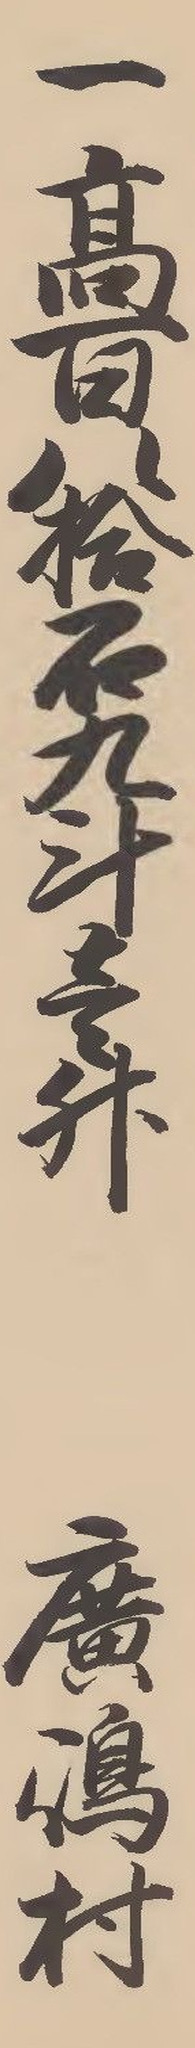一高百八拾石九斗壱升広嶋村
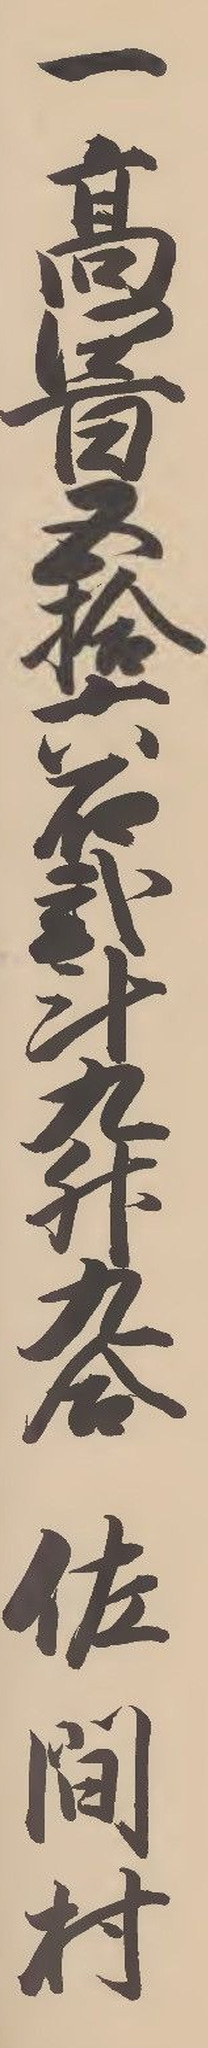一高四百五拾石弐斗九升九合佐間村
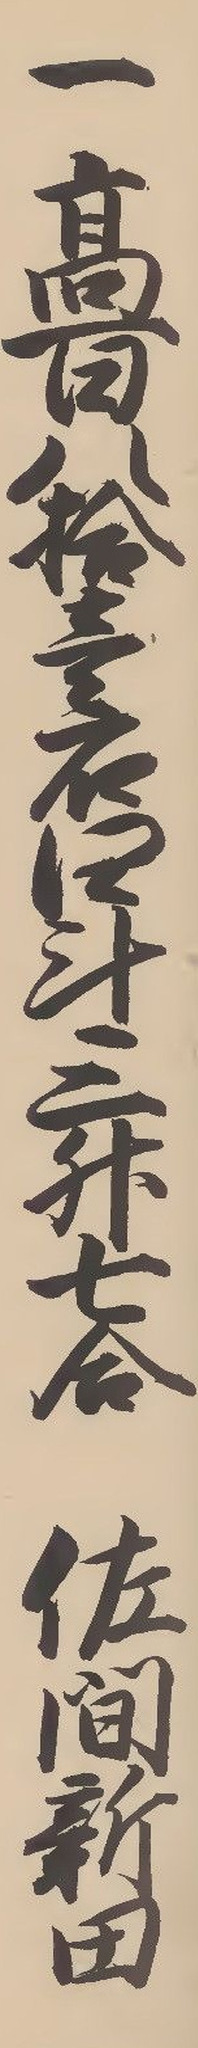一高百八拾壱石四斗三升七合佐間新田
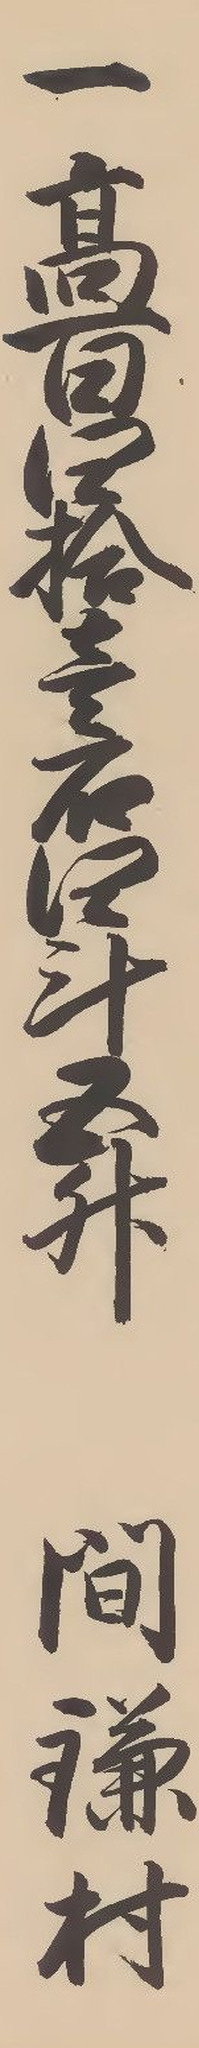一高百四拾壱石四斗五升間鎌村
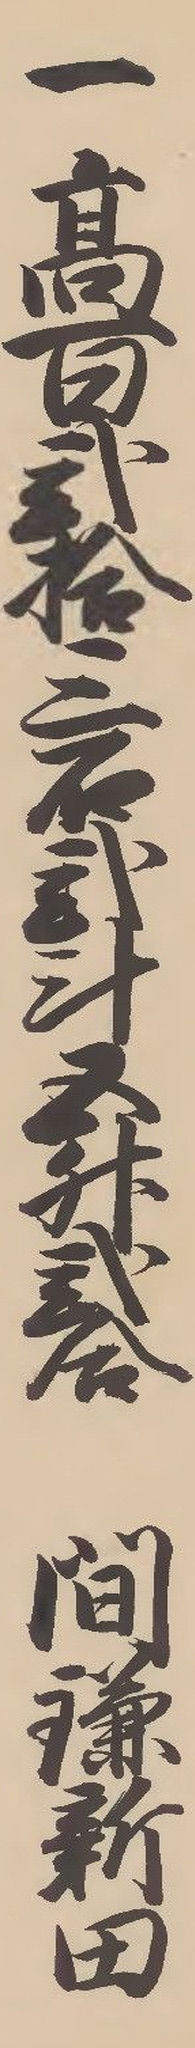一高百弐三石弐斗五升弐合間鎌新田
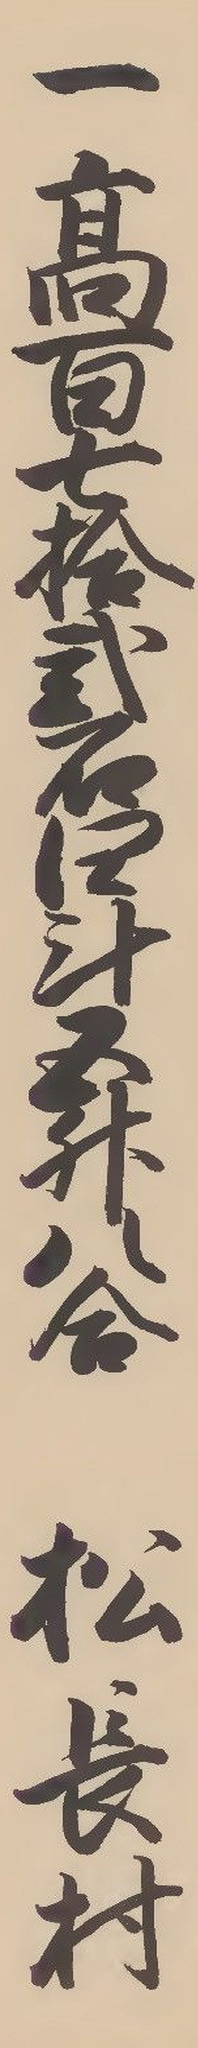一高百七拾弐石四斗五升八合松長村

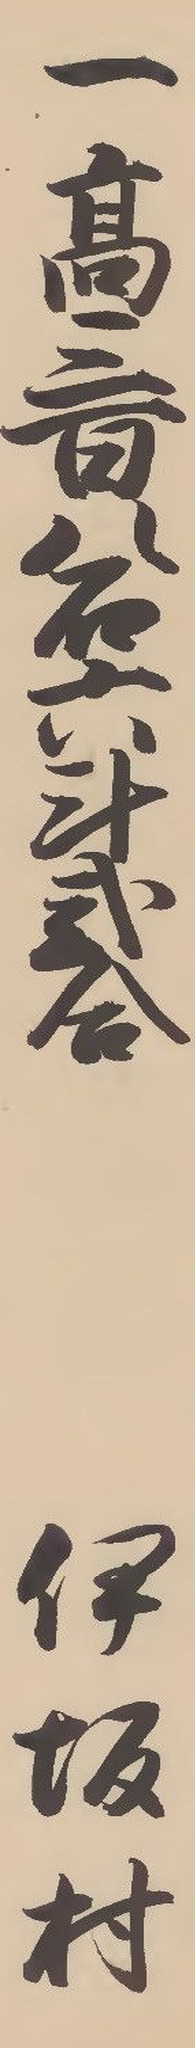一高三百八石六斗弐合伊坂村
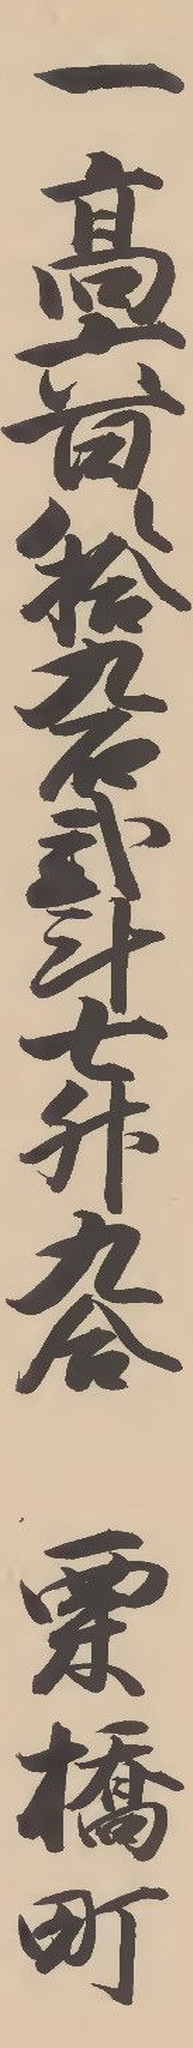一高六百八拾九石弐斗七升九合栗橋町
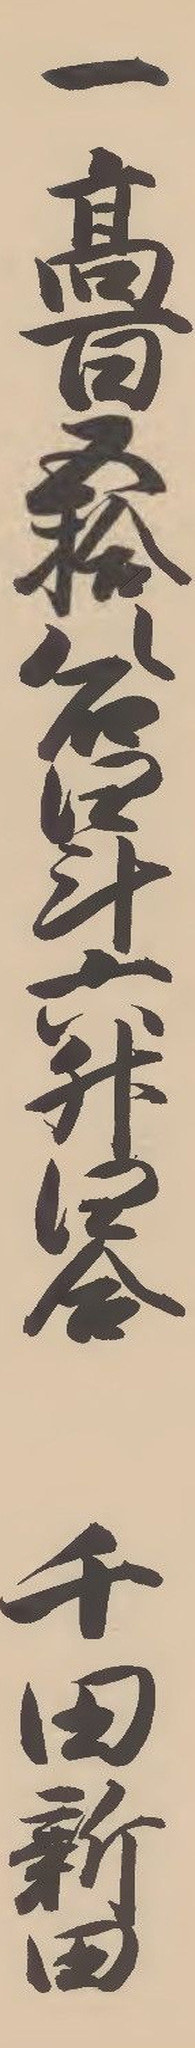一高百五拾八石四斗六升四合千田新田
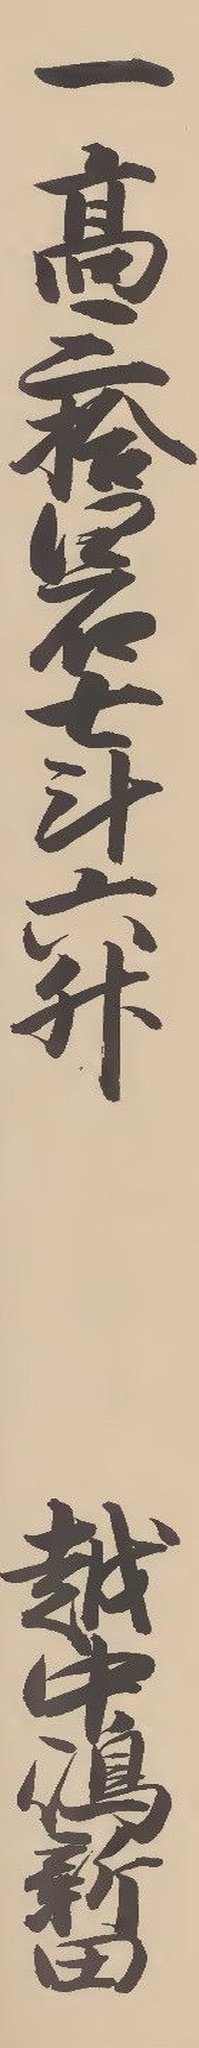一高三拾四石七斗六升越中嶋新田
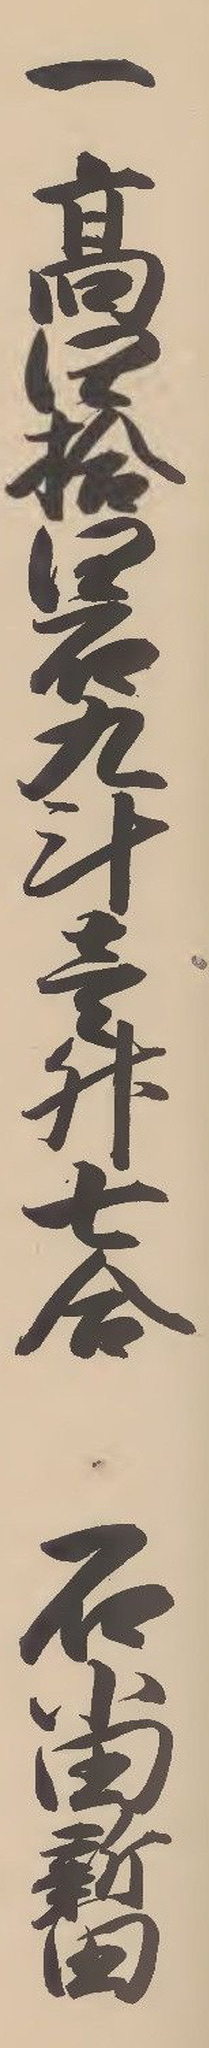一高四拾四石九斗壱升七合石小田新田
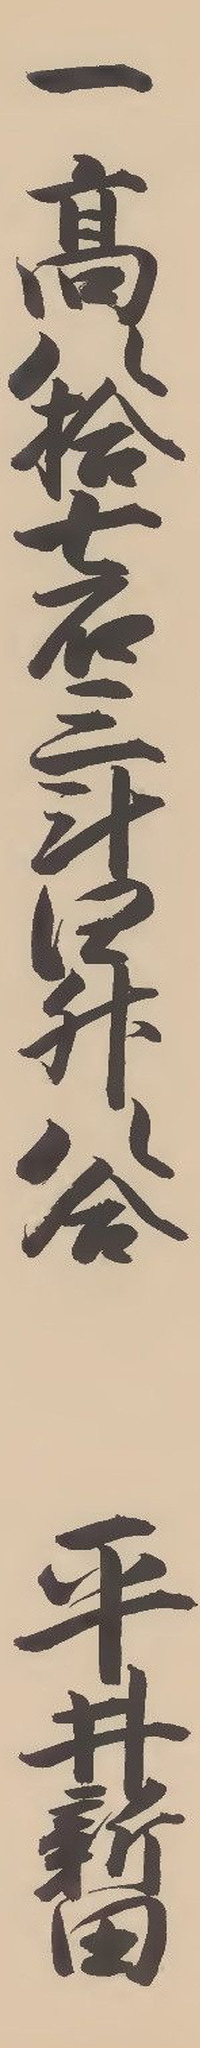一高八拾七石三斗四升八合平井新田
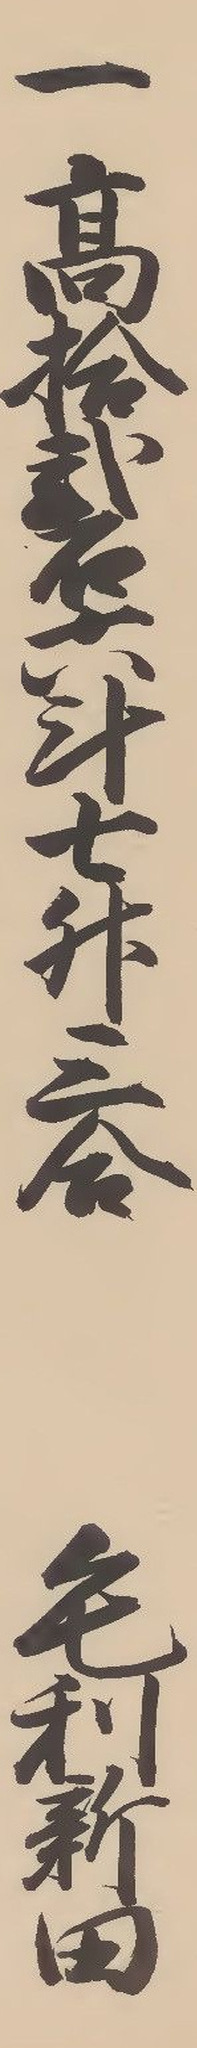一高拾弐石六斗七升三合毛利新田
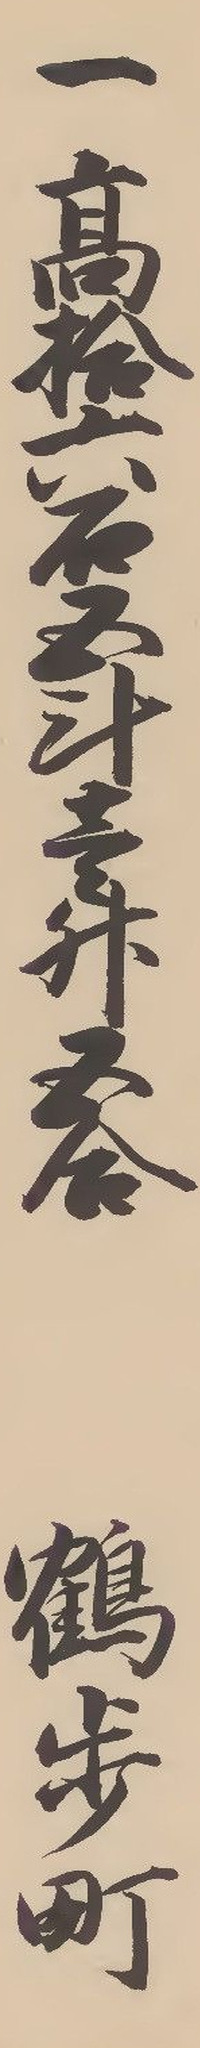一高拾六石五斗壱升五合鶴歩町

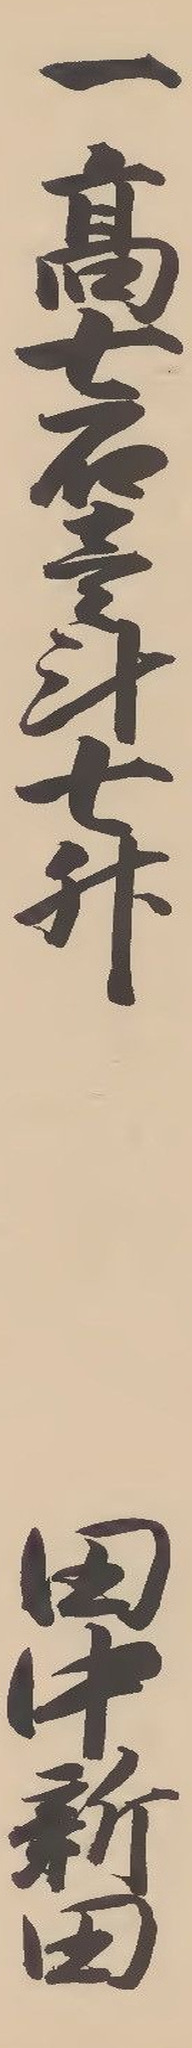一高七石壱斗七升田中新田
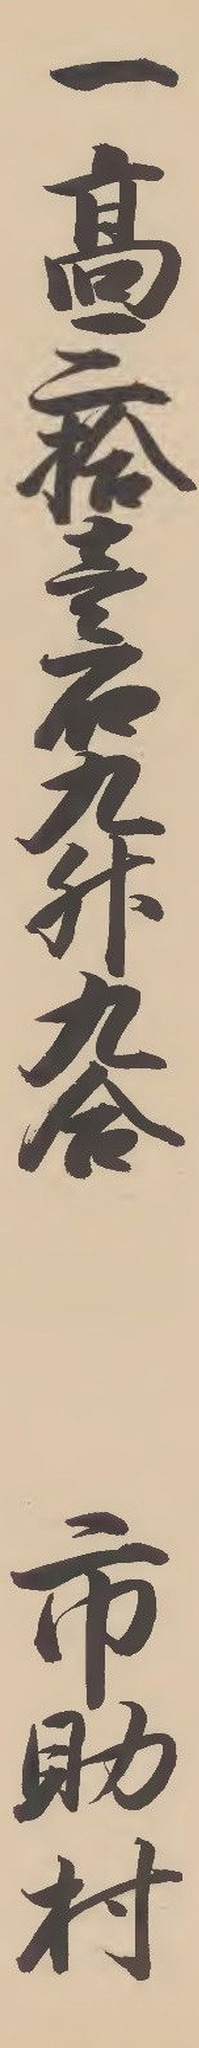一高三拾壱石九升九合市助村
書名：武蔵国郷帳　下
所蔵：国立公文書館 National Archives of Japan
